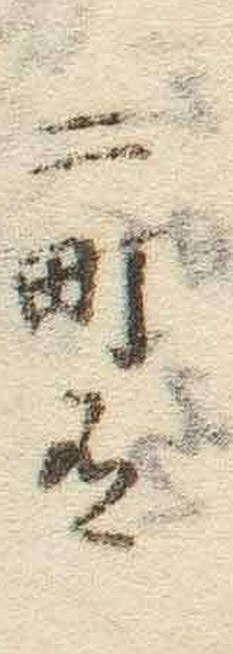四町有
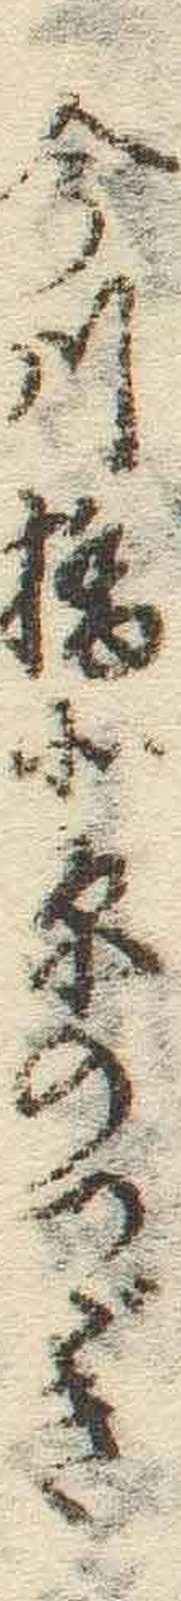今川橋北原のつゞき
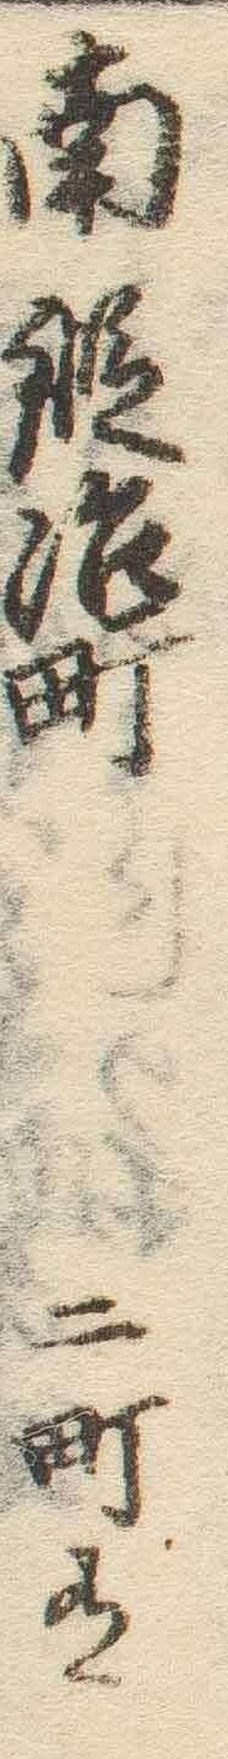南鍛冶町二町有
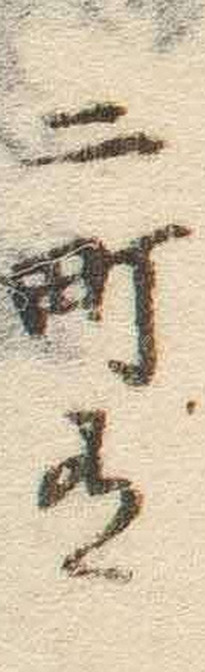四町有
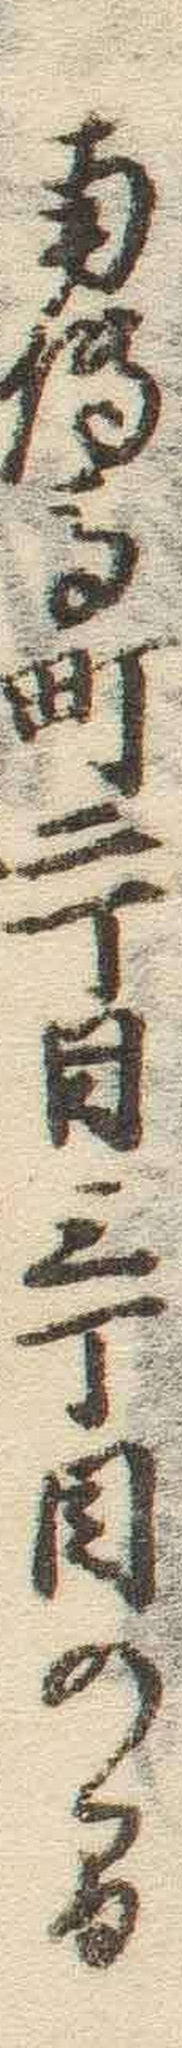南伝馬町二丁目三丁目の間
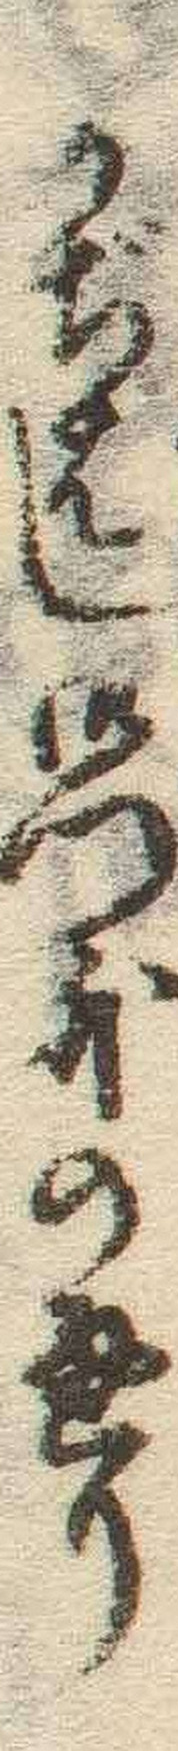かぢはし御門外の通り

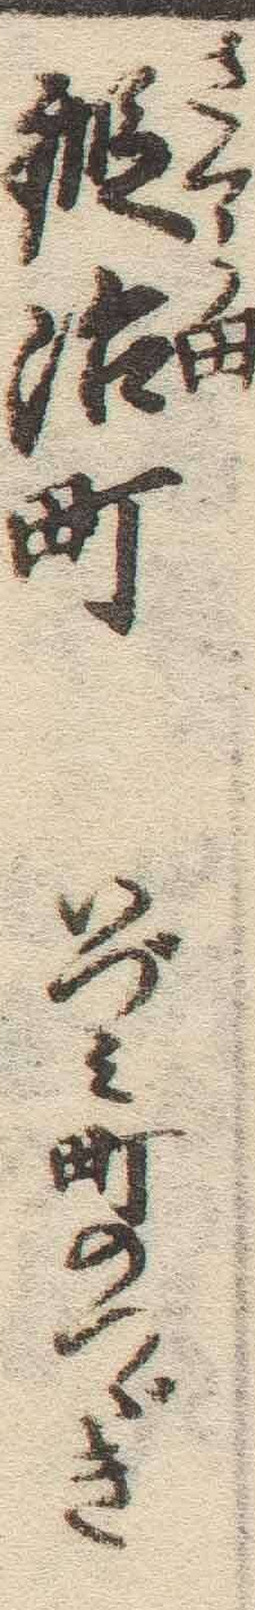鍛冶町いづみ町のつゞき
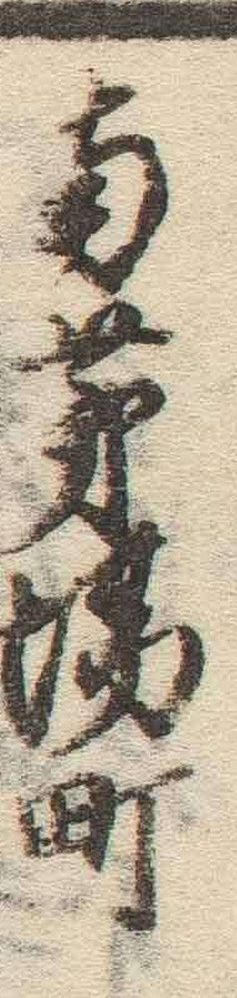南茅場町
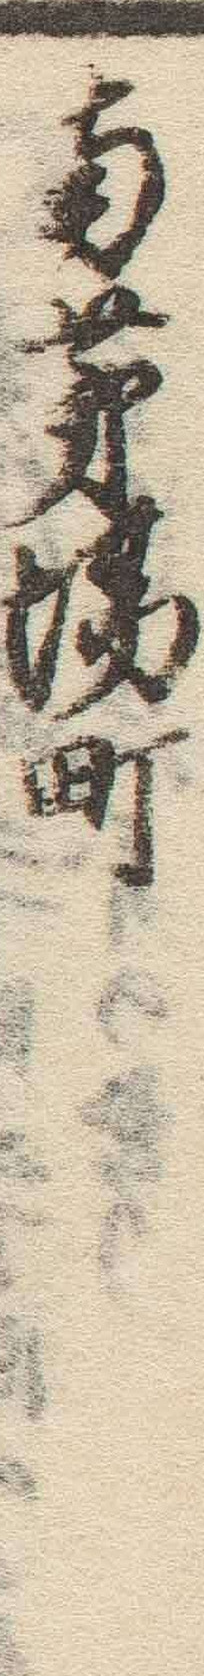南茅場町
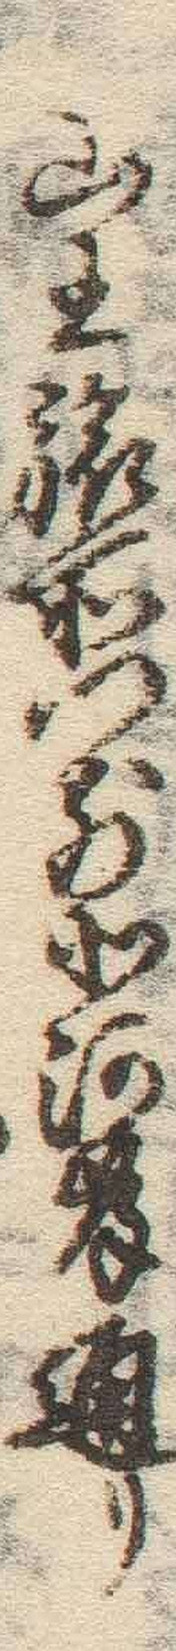山王旅所門前北河岸通り
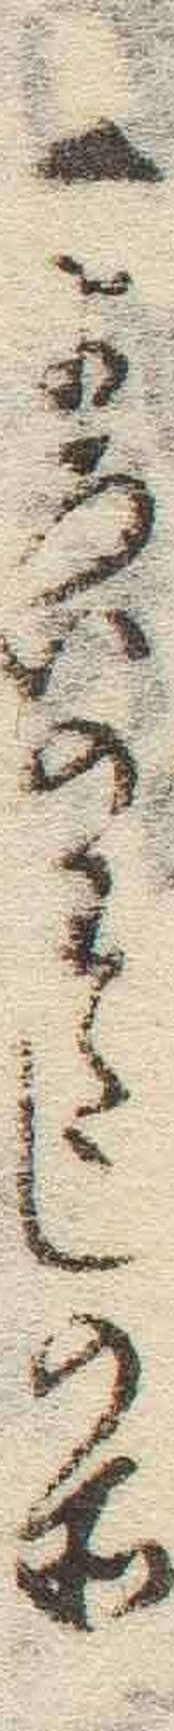▲よろいのわたしの所
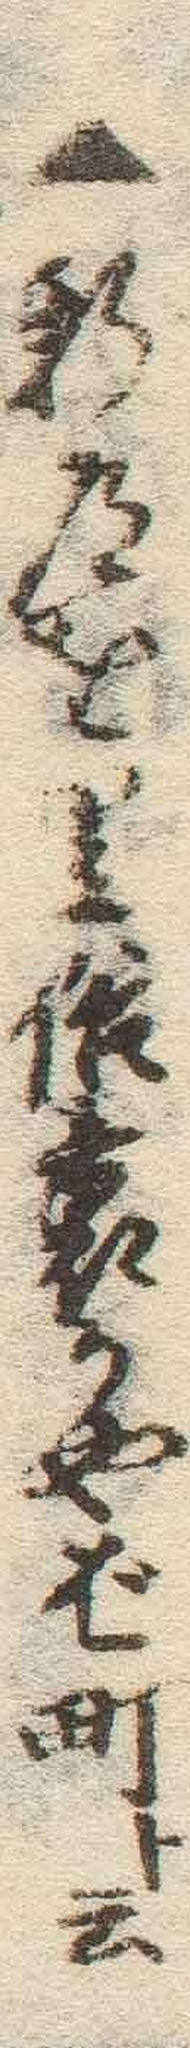▲新道を里俗裏かやば町と云
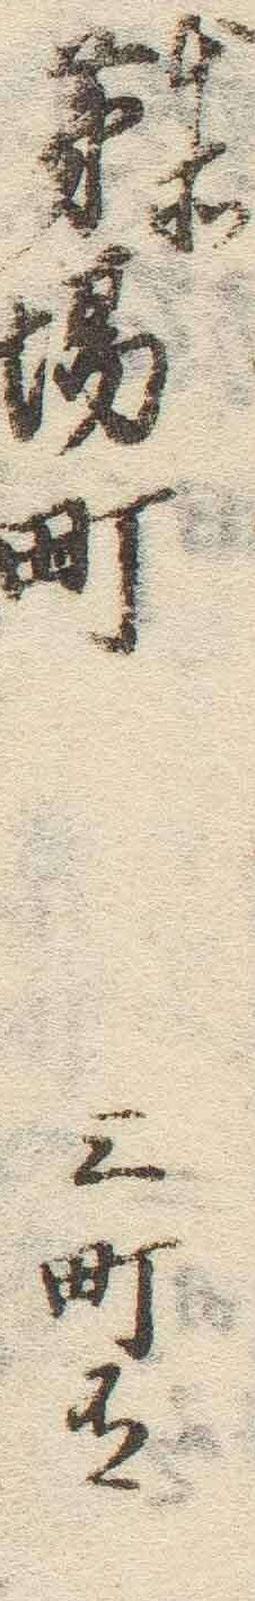茅場町三町有
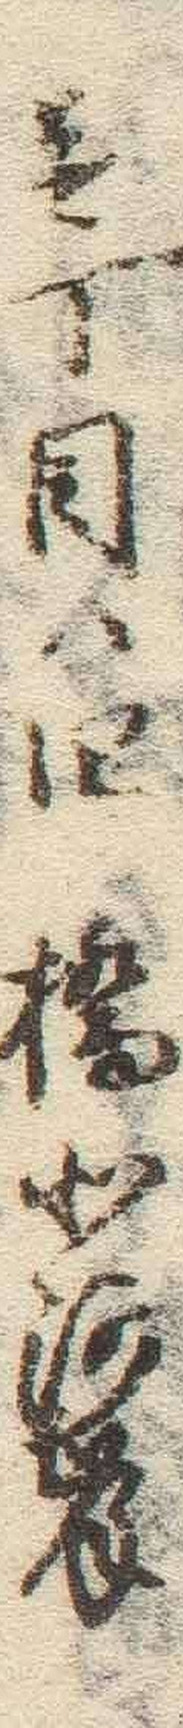壱丁目は四橋北河岸
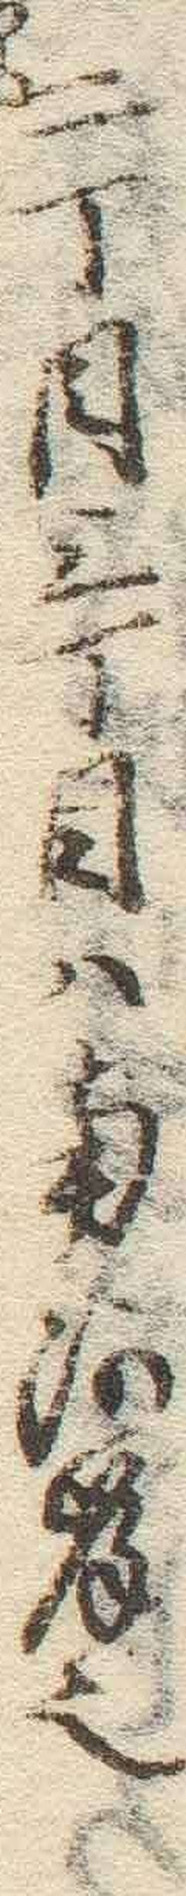二丁目三丁目は南河岸也
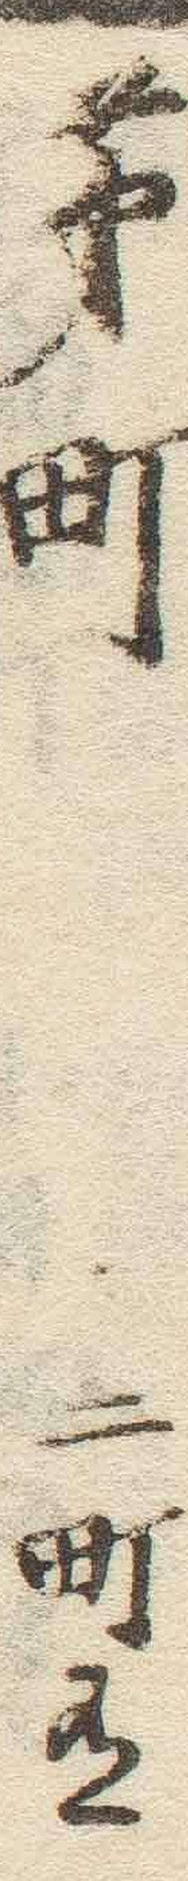茅町二町有
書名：江戸町独案内
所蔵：東京学芸大学附属図書館 国文学研究資料館
